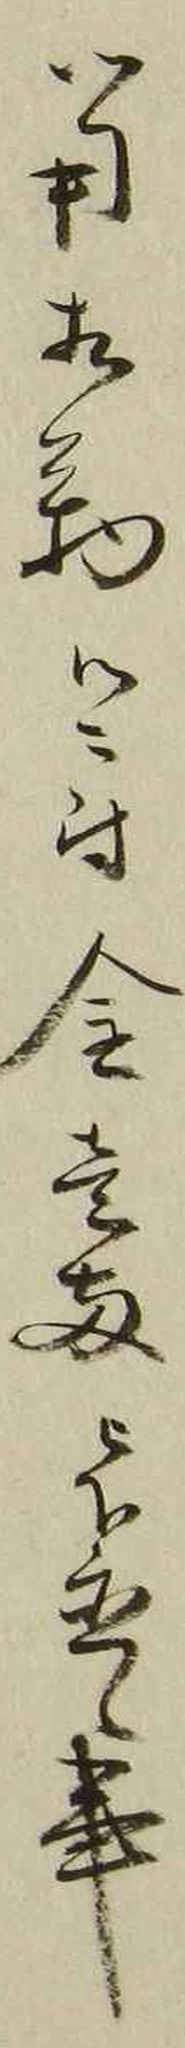御用相勤候ニ付金壱両被下置候事
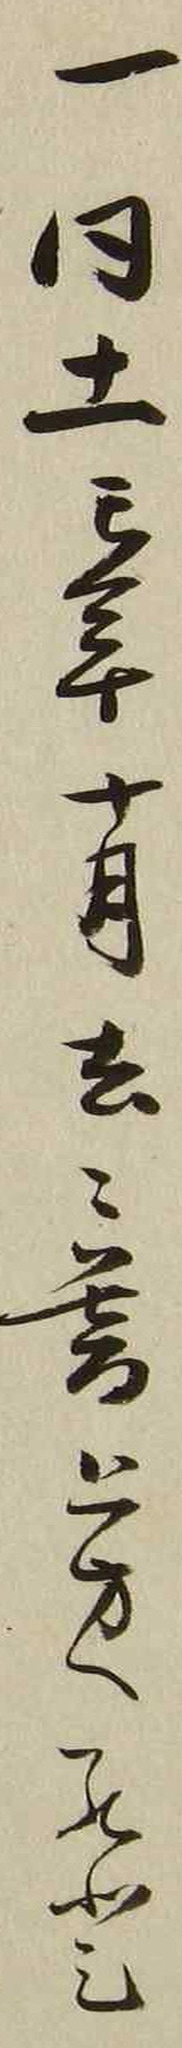一同十一巳年十月去々暮上方へ罷登
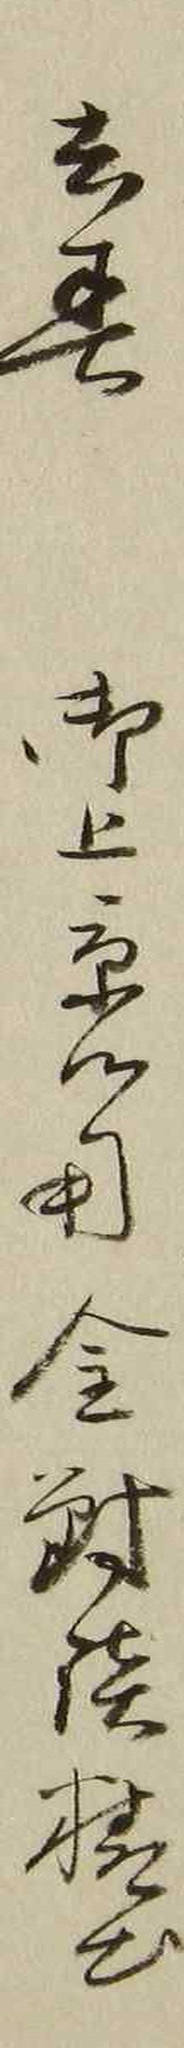去春御上京御用金対談精出
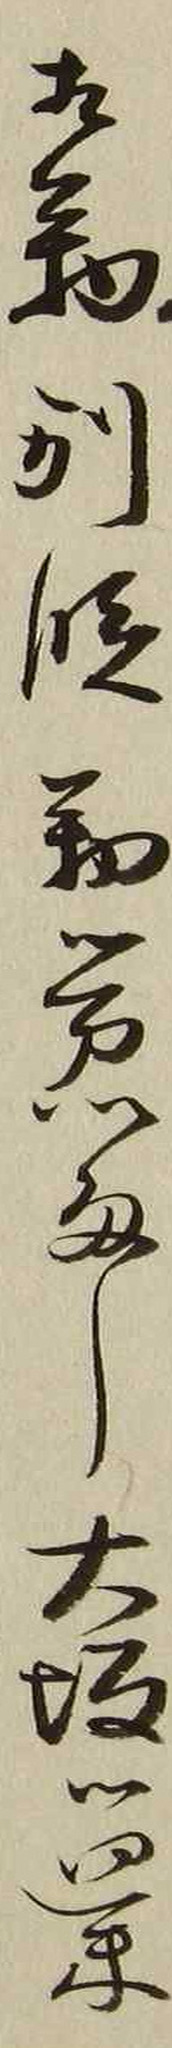相勤別段勤労いたし大坂御廻米
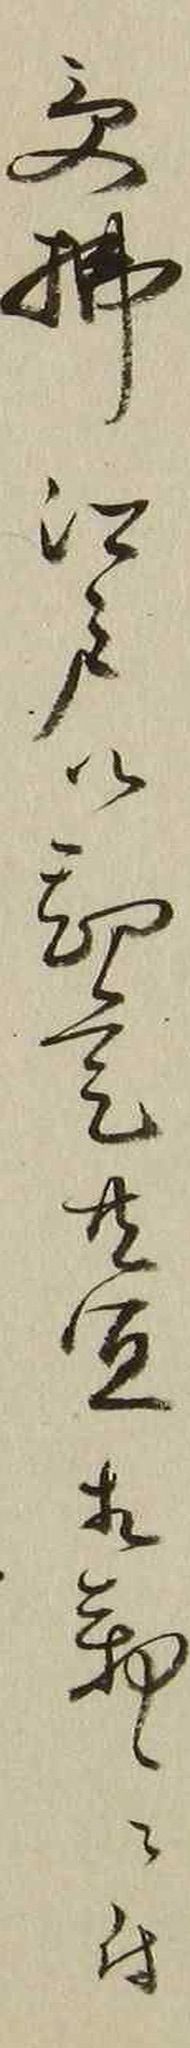受払江戸御勘定共宜相勤候ニ付
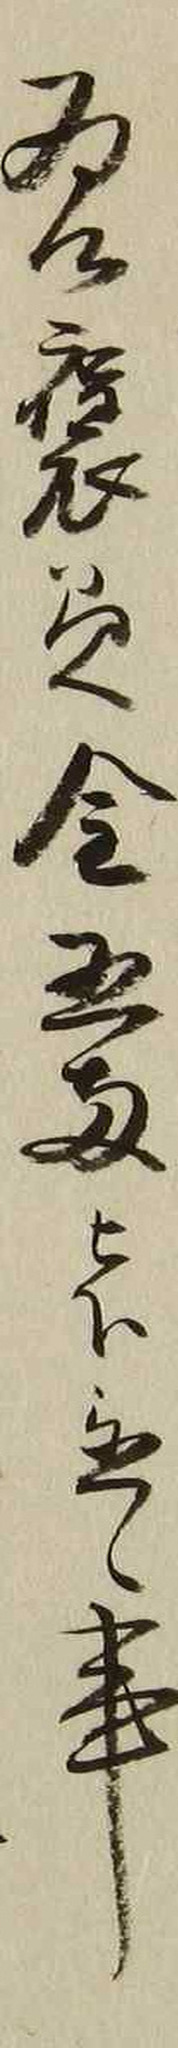為御褒美金五両被下置候事
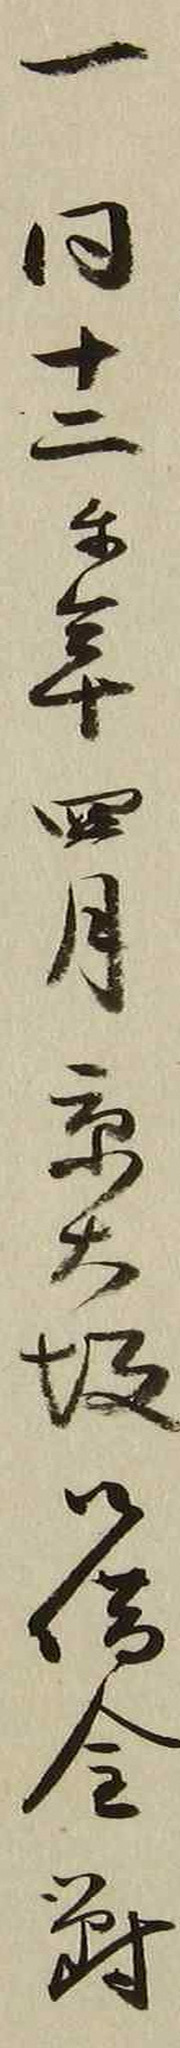一同十二午年四月京大坂御借金対
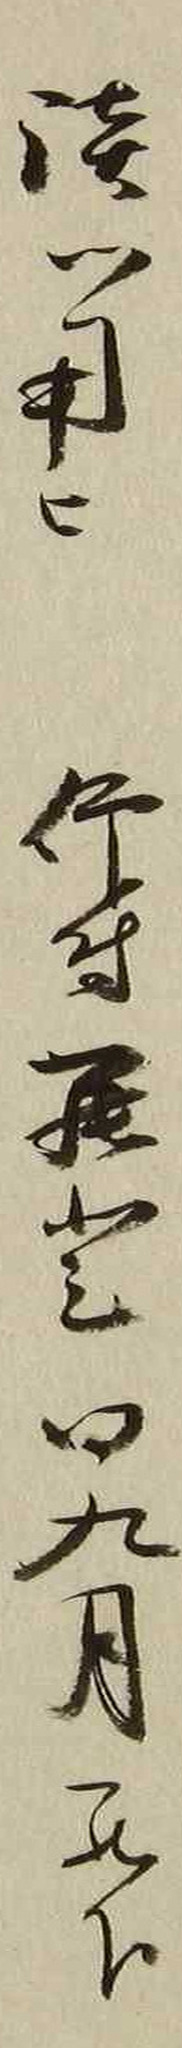談御用被仰付罷登同九月罷下
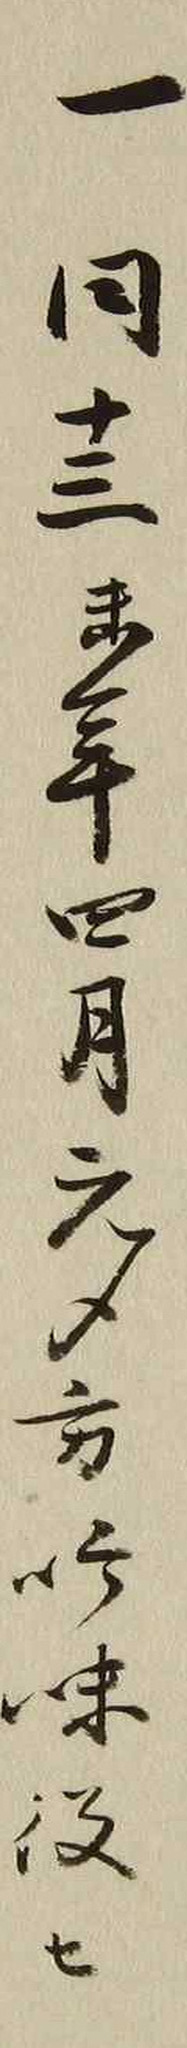一同十三未年四月元〆方吟味役被
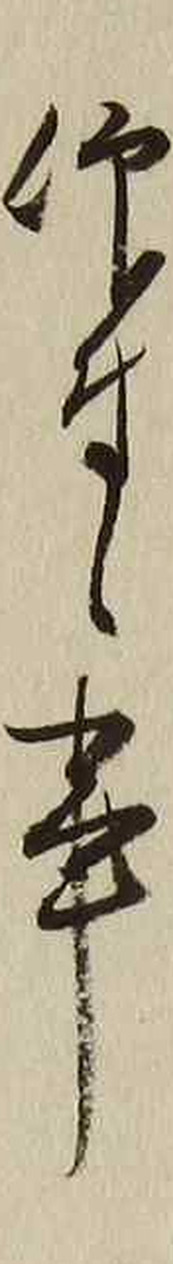仰付候事
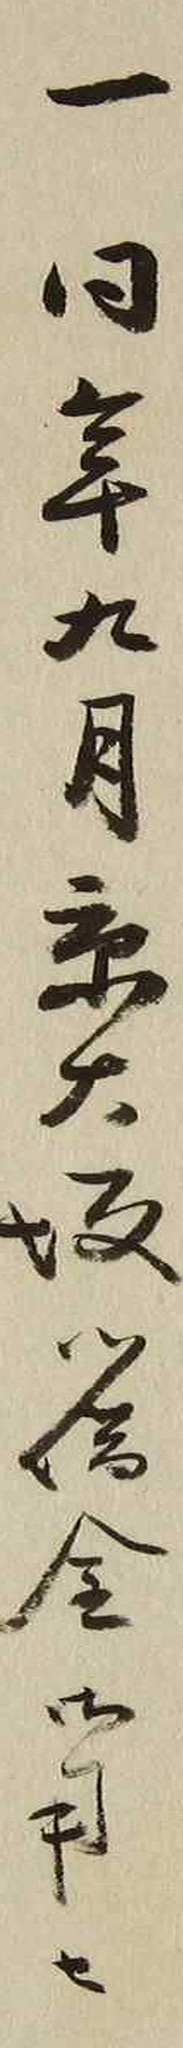一同年九月京大坂御借金御用被
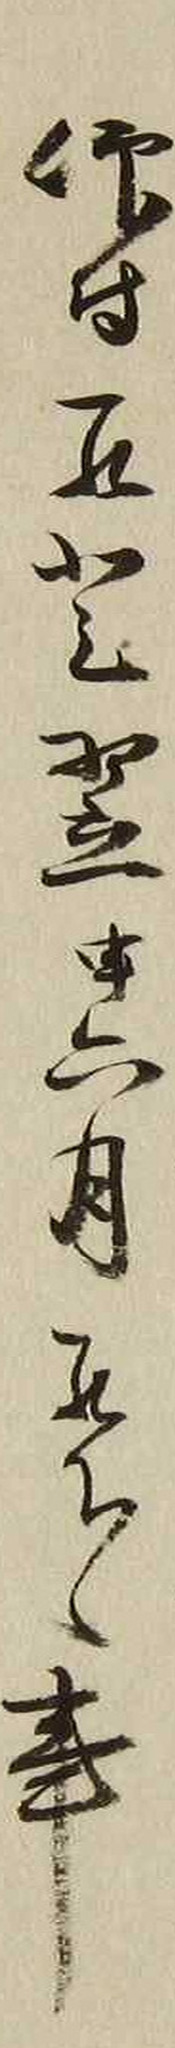仰付罷登翌申六月罷下候事
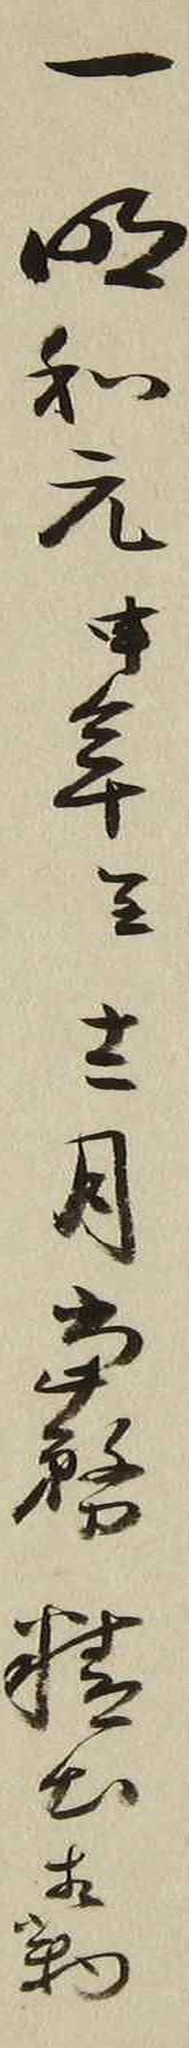一明和元申年閏十二月当務精出相勤
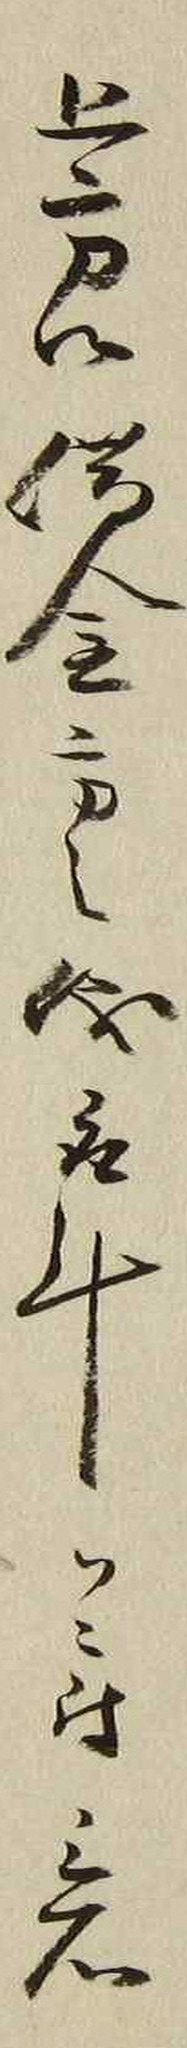上方御借金方之儀取計候ニ付三石
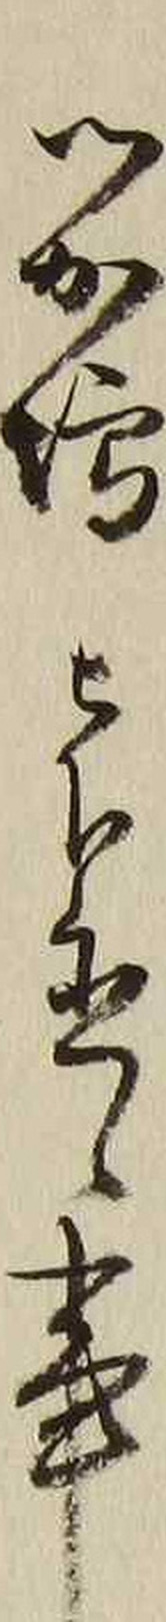御加増被下置候事
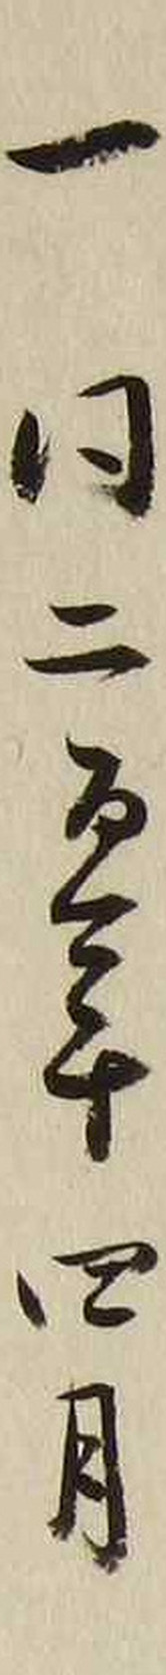一同二酉年四月
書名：諸士系譜　巻之288　さ之部20
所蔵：会津若松市立会津図書館
